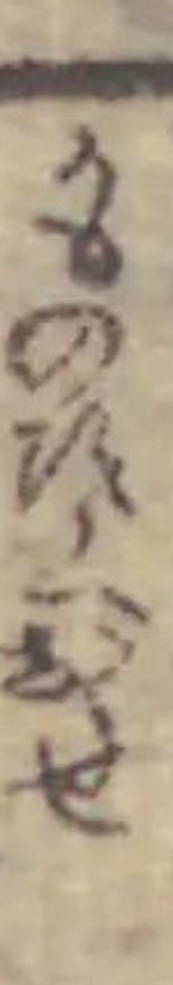かもの次郎へおゝせ
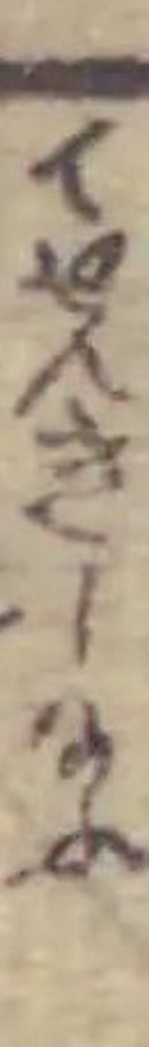てせんきし給ふ
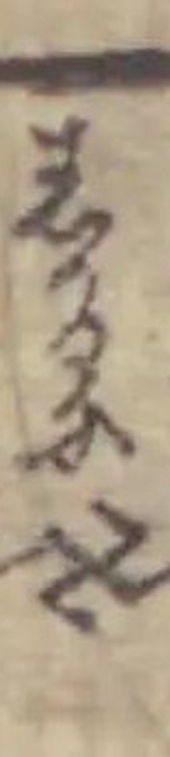しかるに
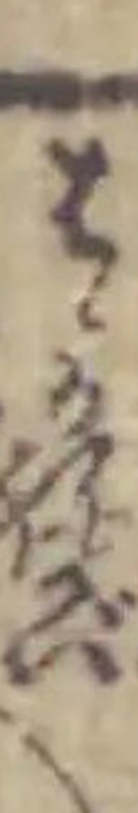はゝかねがい
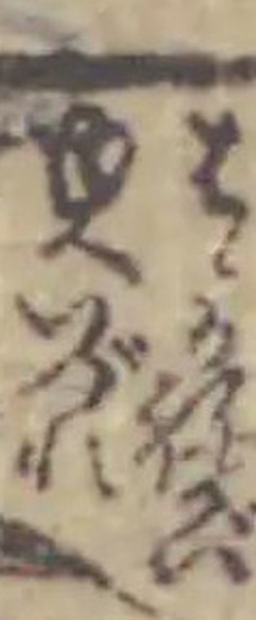ゆへいづれ
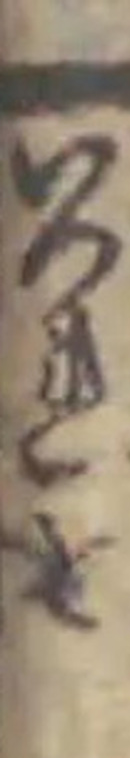いつれを
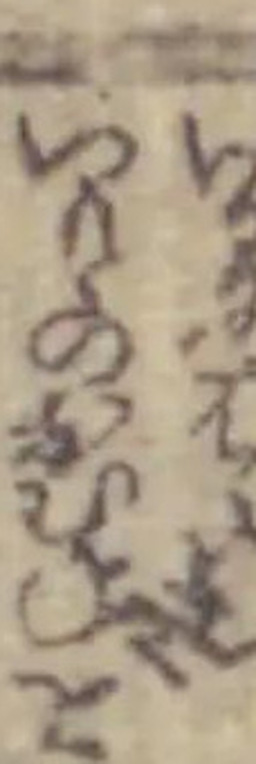いもとのおむねを
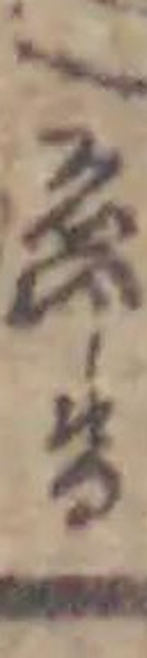ゑいしける
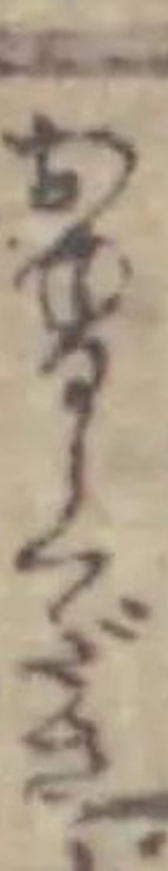おゆるしくださ
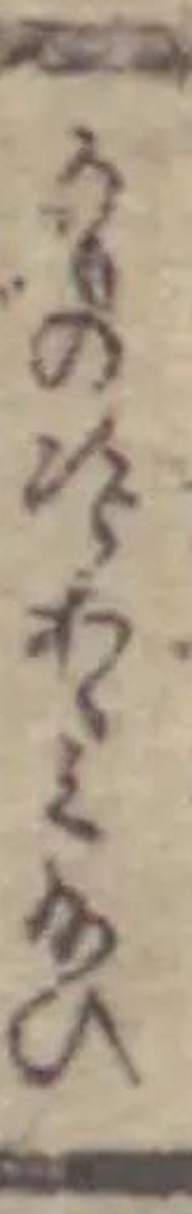かもの次郎あくみ給ひ
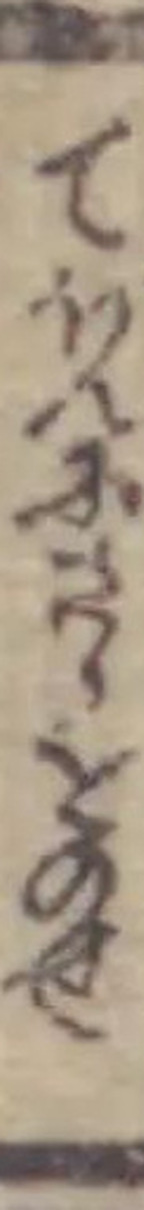てぼんにさらをのせ
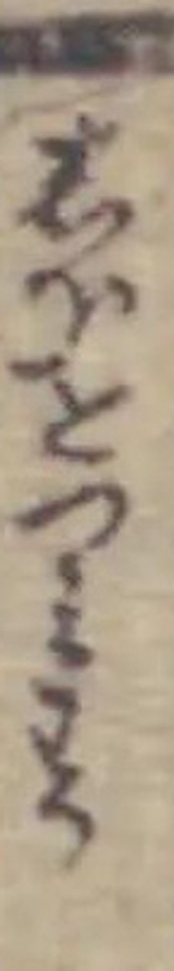しほをつみわか
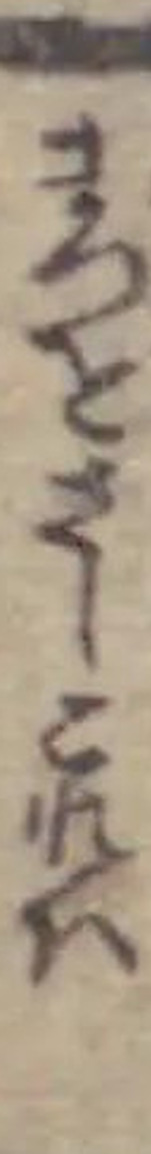まつをさしこれは
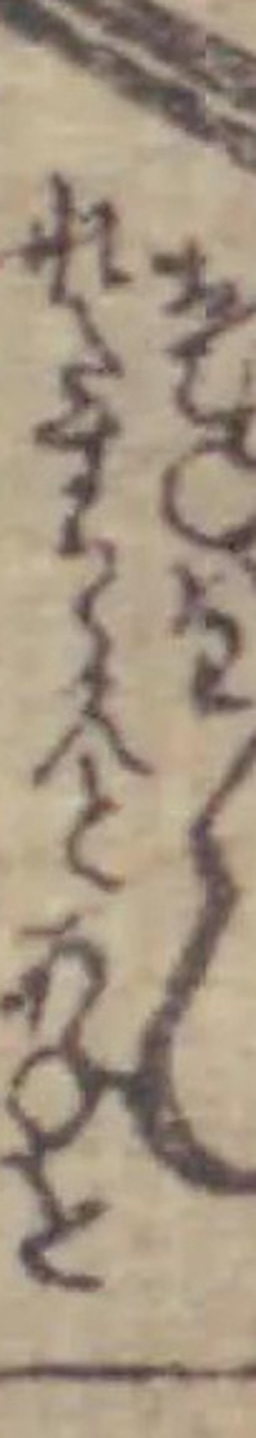れたすからんとあねを
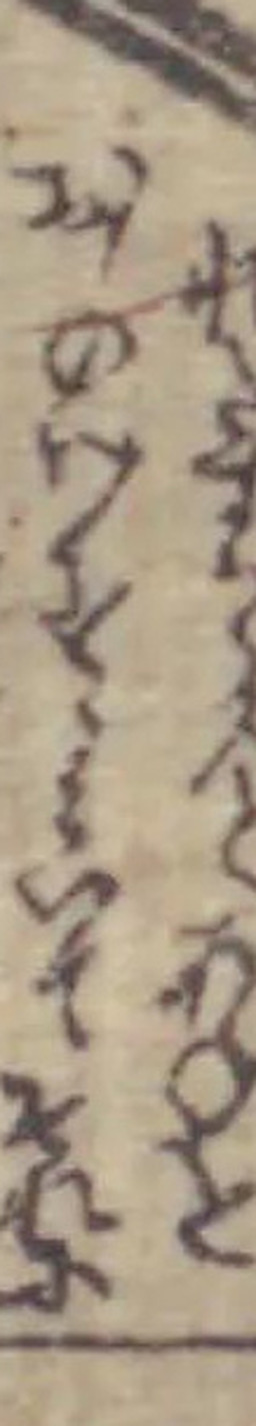おしのけすゝみいてそれに
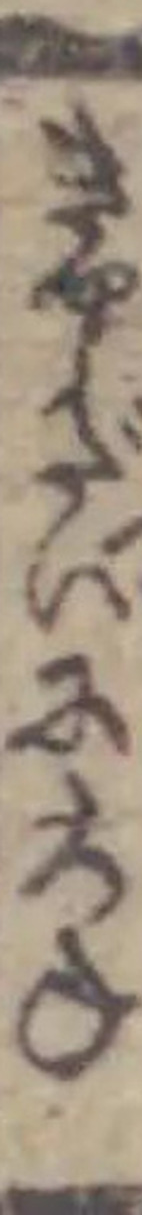きやうだいにたつね
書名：奥州咄 3巻
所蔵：国立国会図書館 National Diet Library, JAPAN
